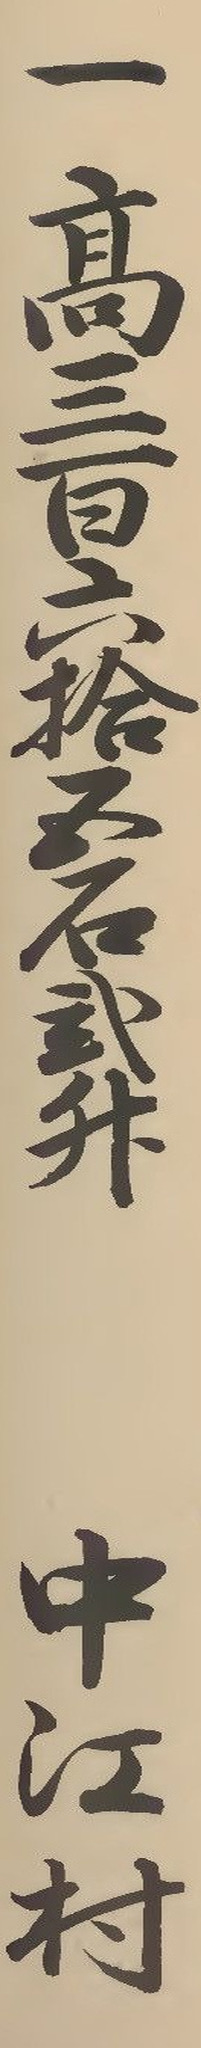一高三百六拾五石弐升中江村
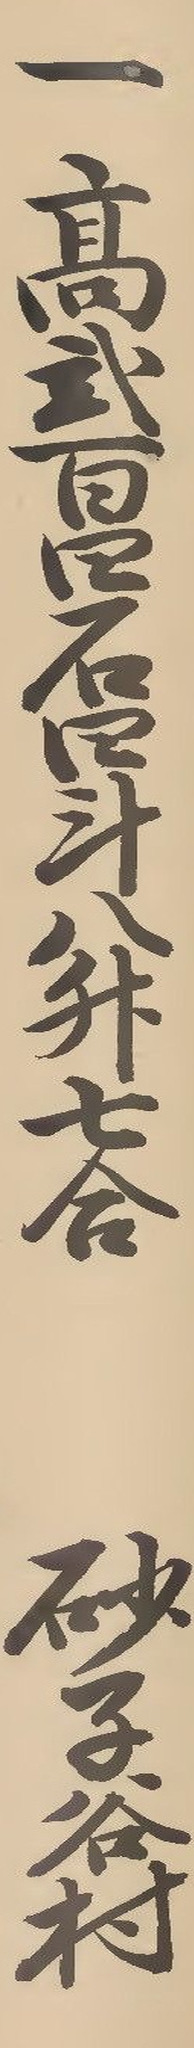一高弐百四石四斗八升七合砂子谷村
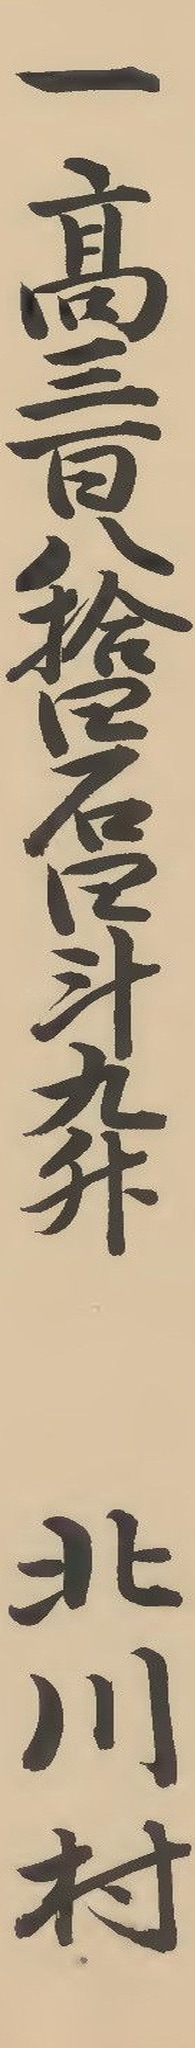一高三百八拾四石四斗九升北川村
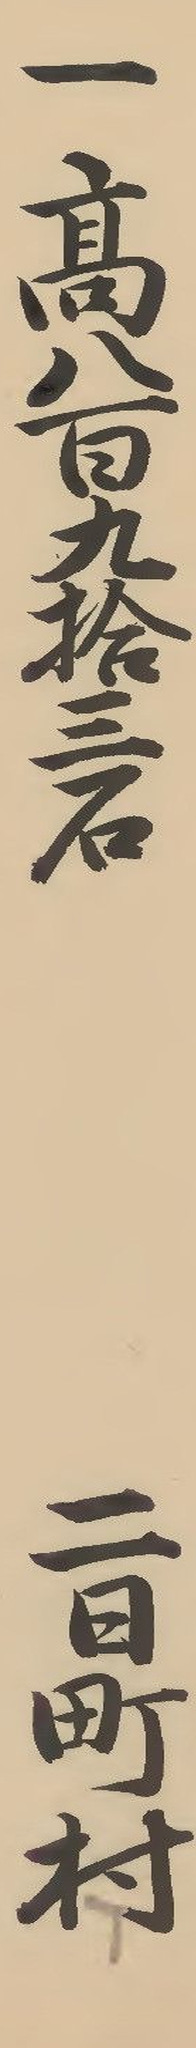一高八百九拾三石二日町村
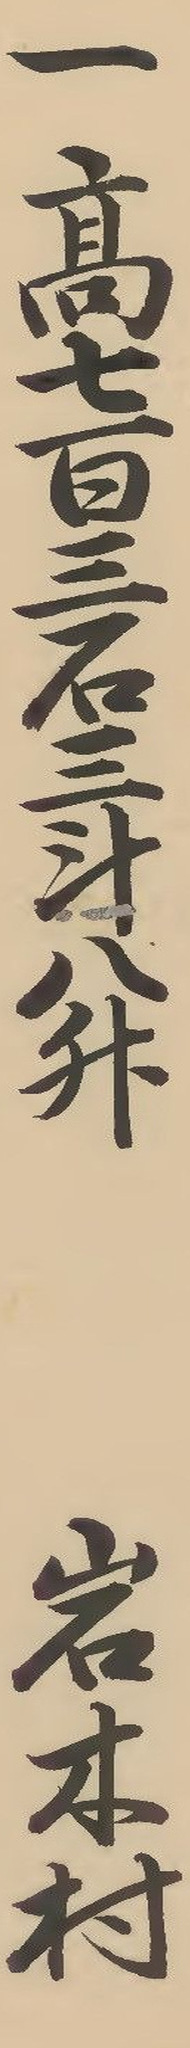一高七百三石三斗八升岩木村

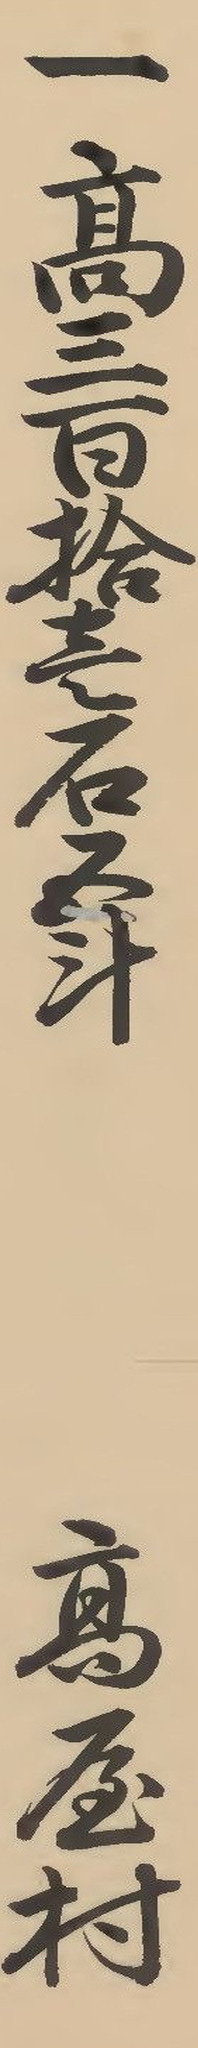一高三百拾壱石五斗高屋村
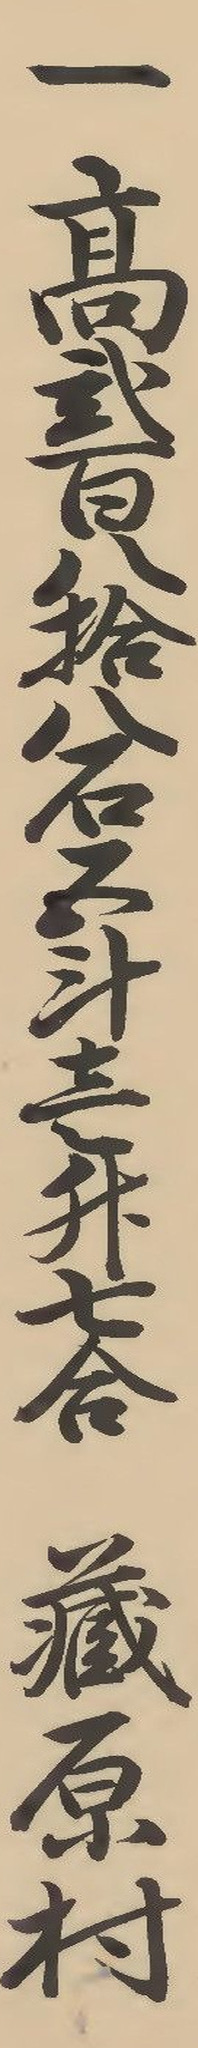一高弐百八拾八石五斗壱升七合蔵原村
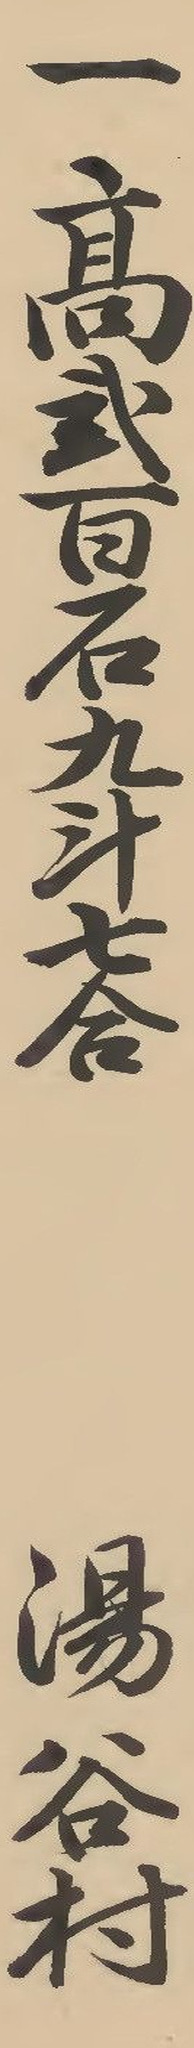一高弐百石九斗七合湯谷村
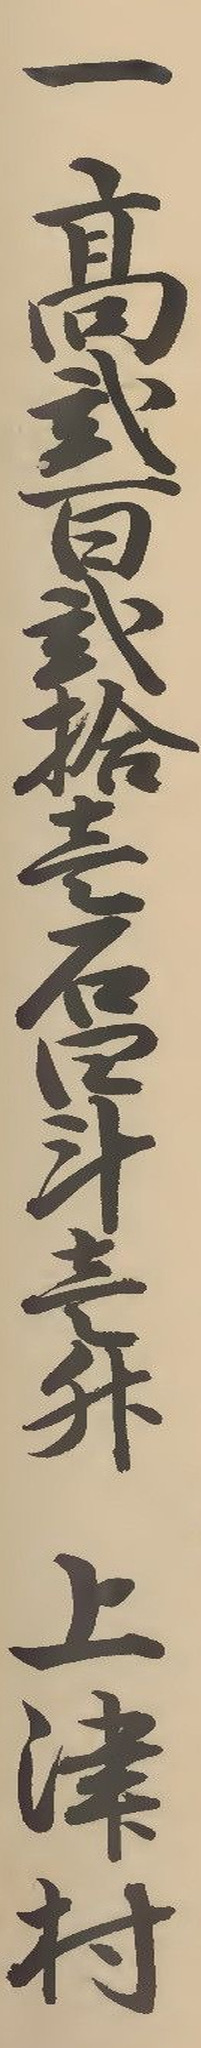一高弐百弐拾壱石四斗壱升上津村
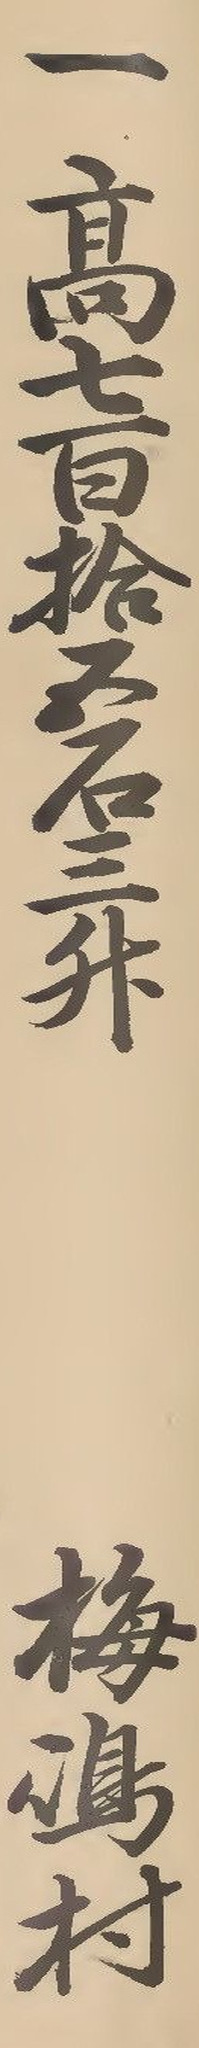一高七百拾五石三升梅島村
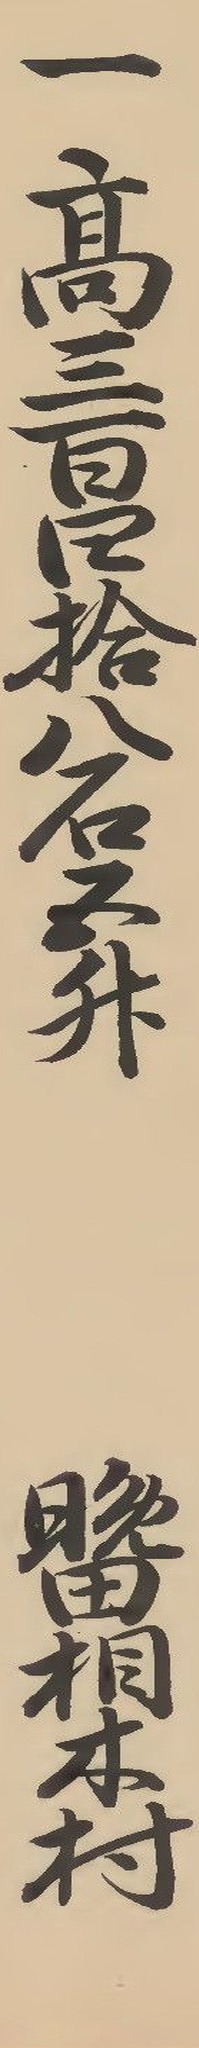一高三百四拾八石五升晩田相木村
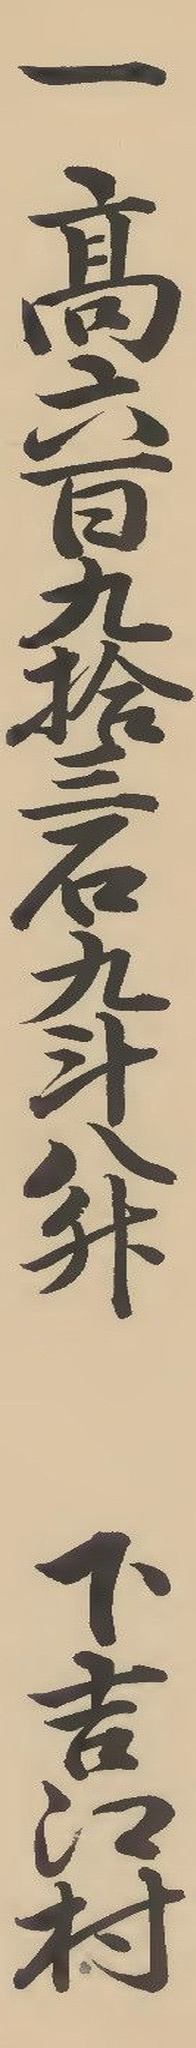一高六百九拾三石九斗八升下吉江村
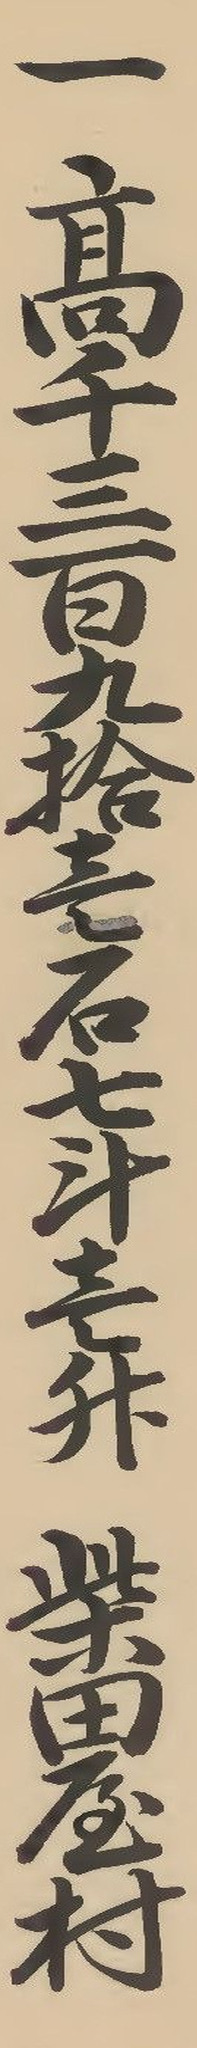一高千三百九拾壱石七斗壱升柴田屋村

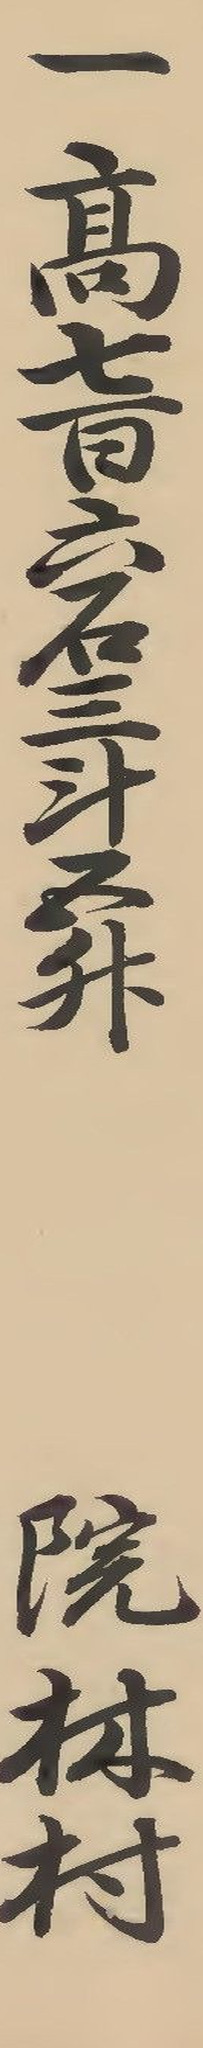一高七百六石三斗五升院林村
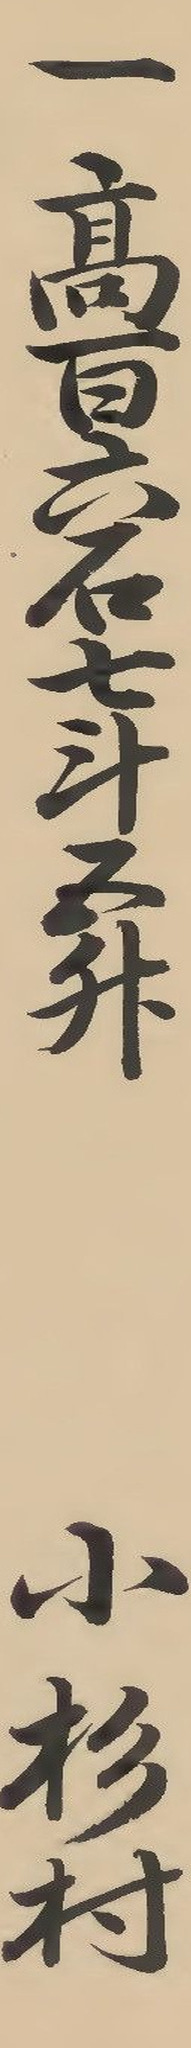一高百六石七斗五升小杉村
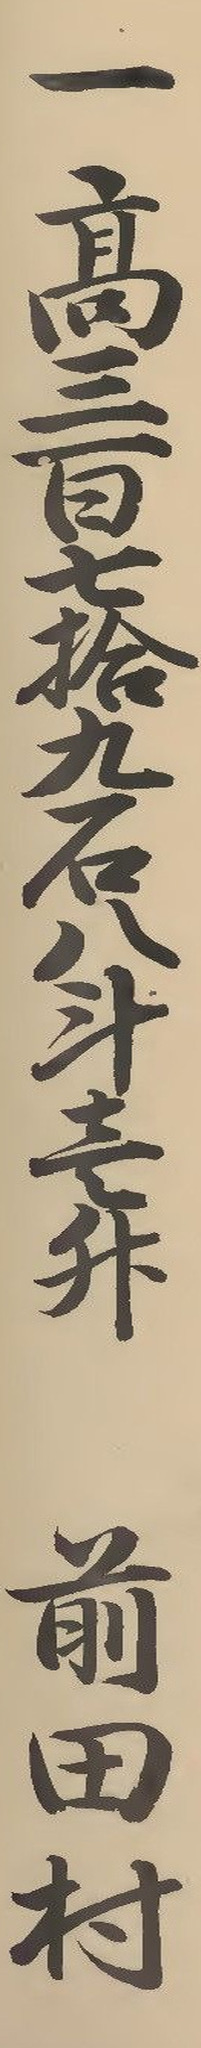一高三百七拾九石八斗壱升前田村
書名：越中国郷帳
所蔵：国立公文書館 National Archives of Japan
